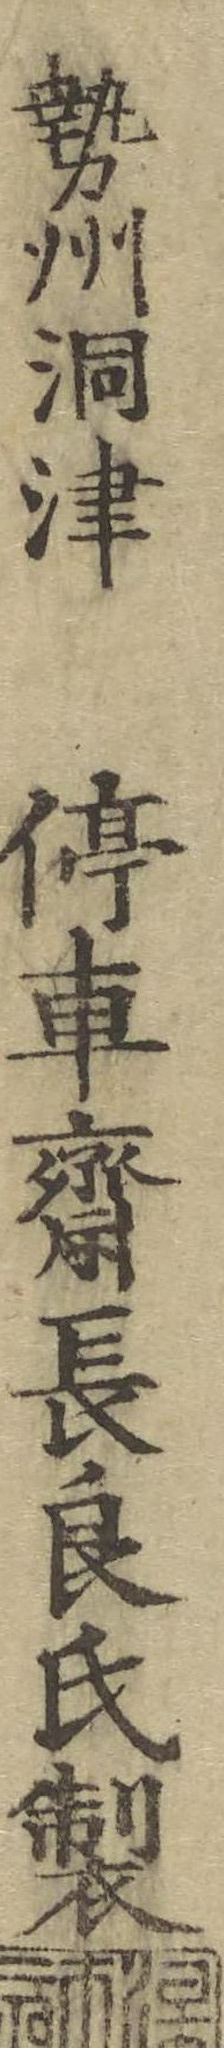勢州洞津停車斎長良氏製
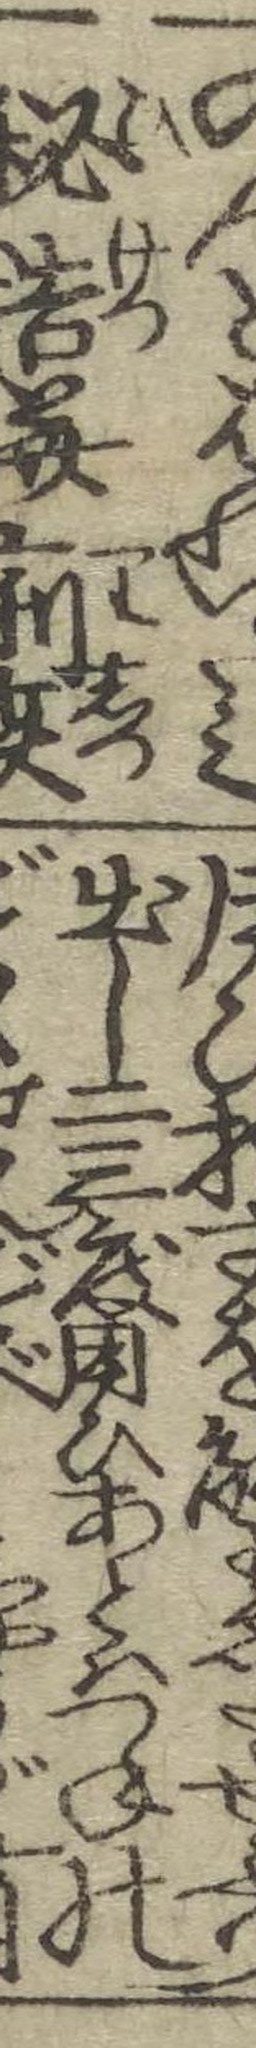出し二三度用ひあとはつねの
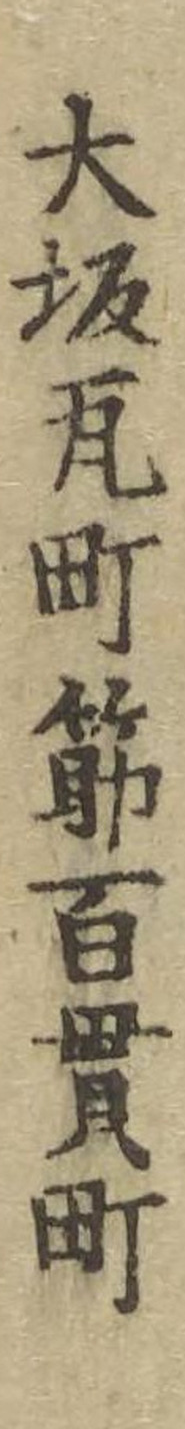大坂瓦町筋百貫町
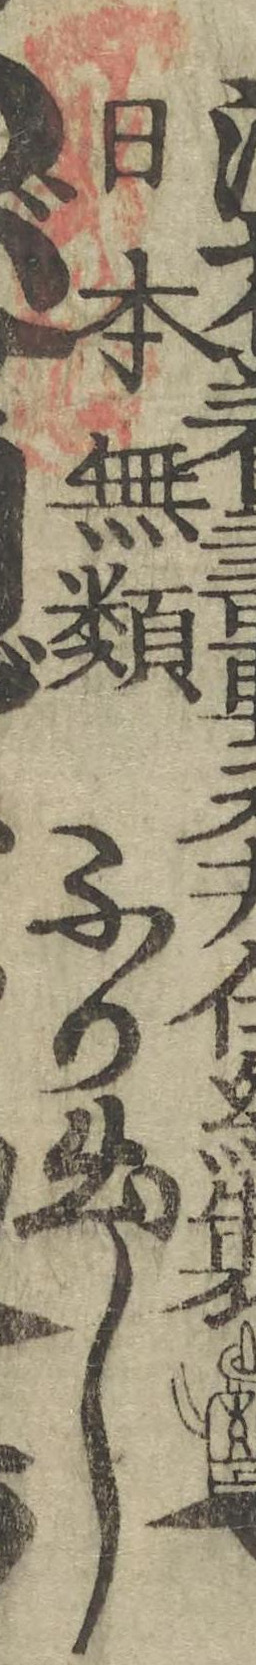日本無類ふり出し
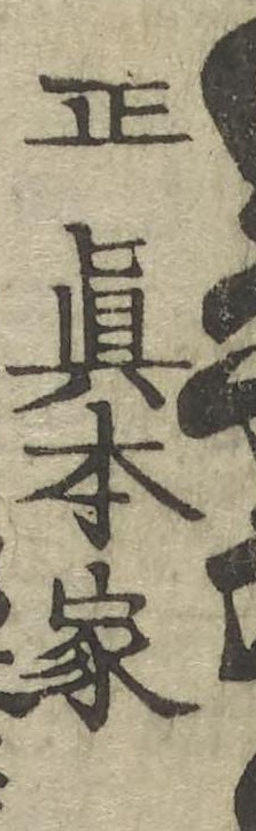正真本家
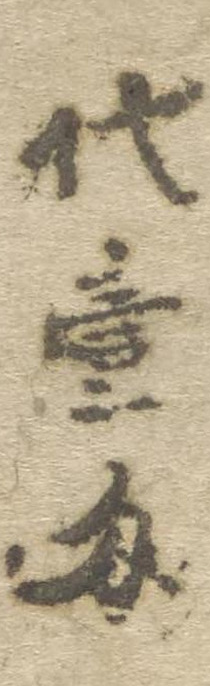代壱匁
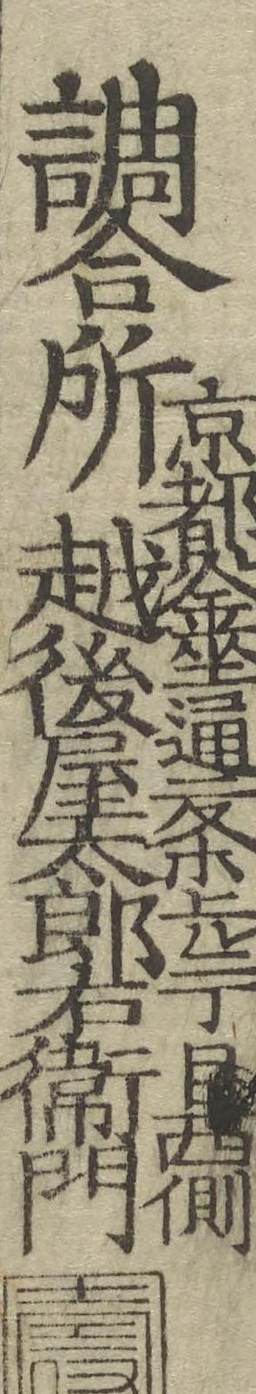調合所越後屋太郎右衛門
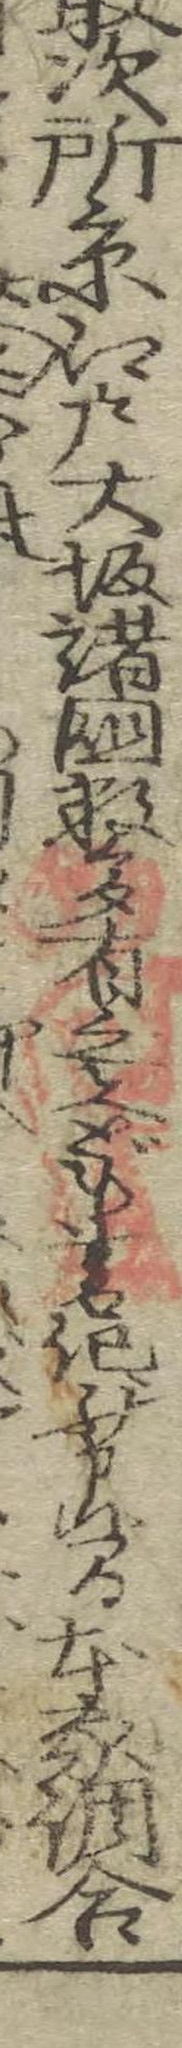取次所京江戸大坂諸国数多有之候へども書記し不申候間本家調合
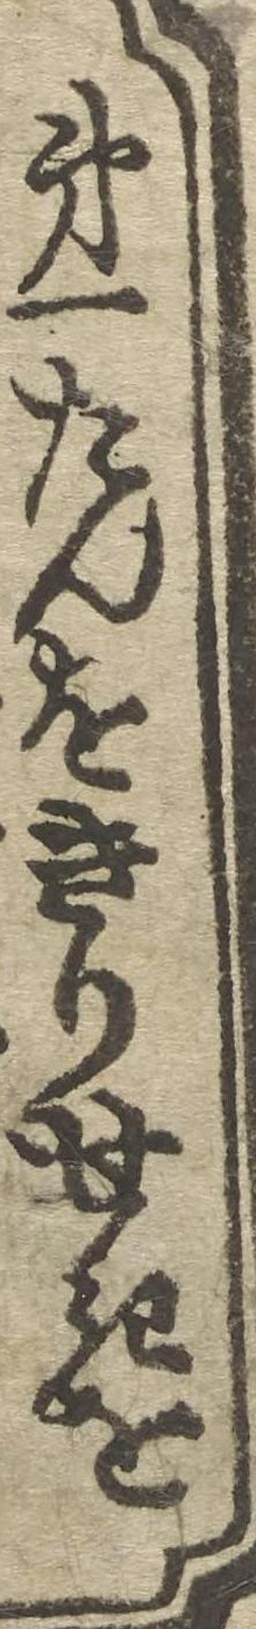第一たんをきりせきを
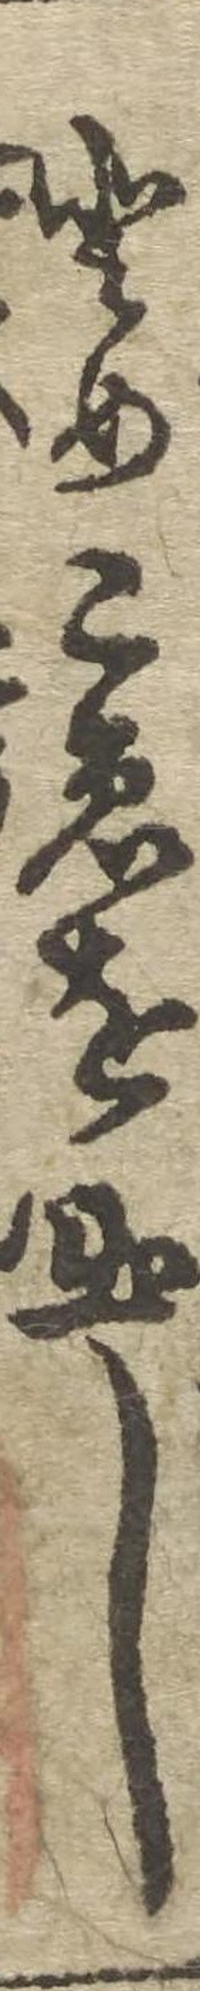とめこゑを出し
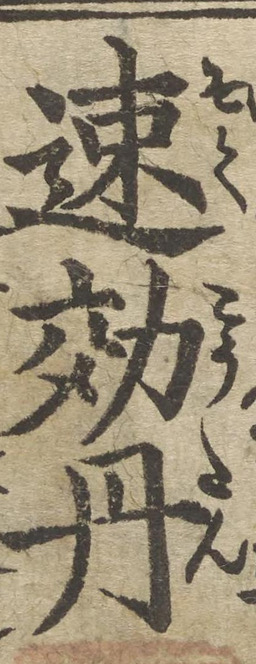速効丹
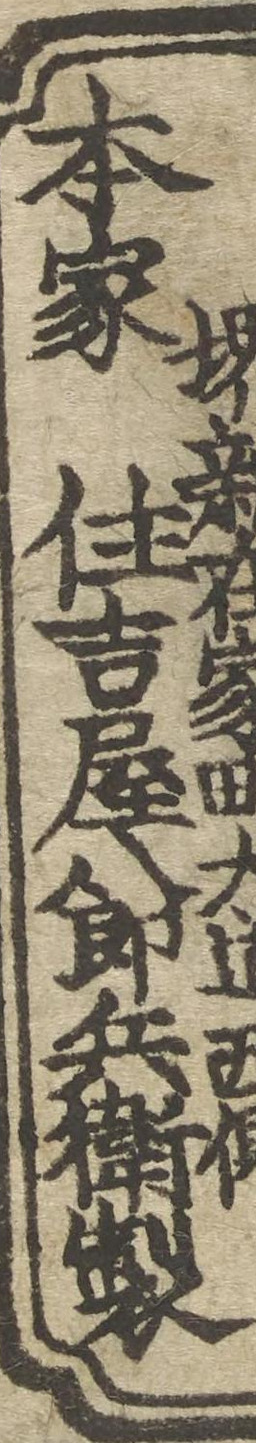本家住吉屋八郎兵衛製
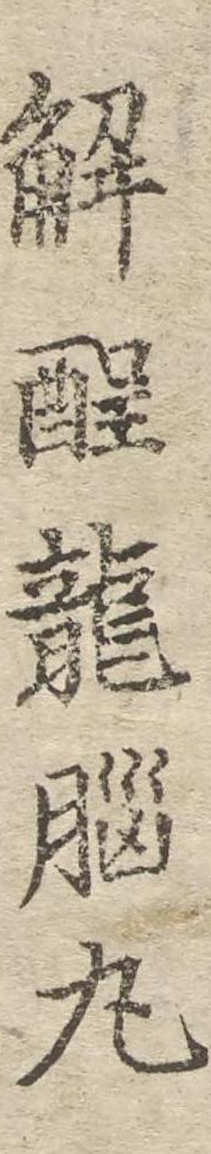解酲龍脳丸
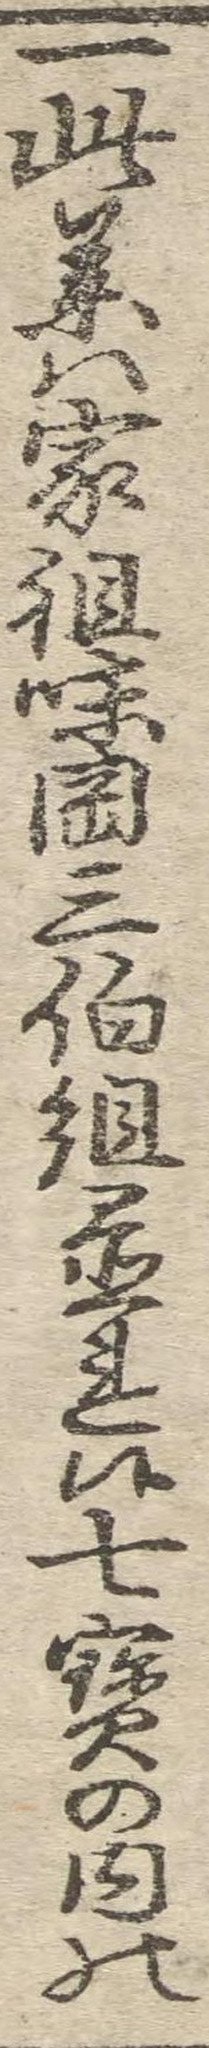一此薬は家祖味岡三伯組置れ候七宝の内の
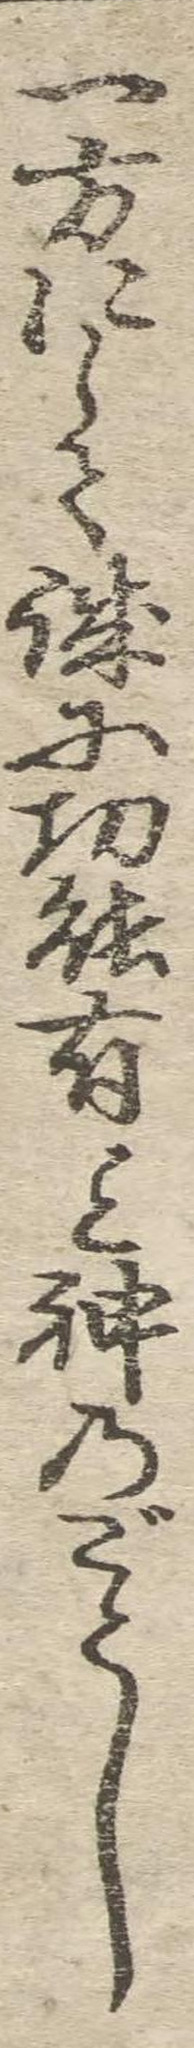一方にして誠に功能有こと神のごとし
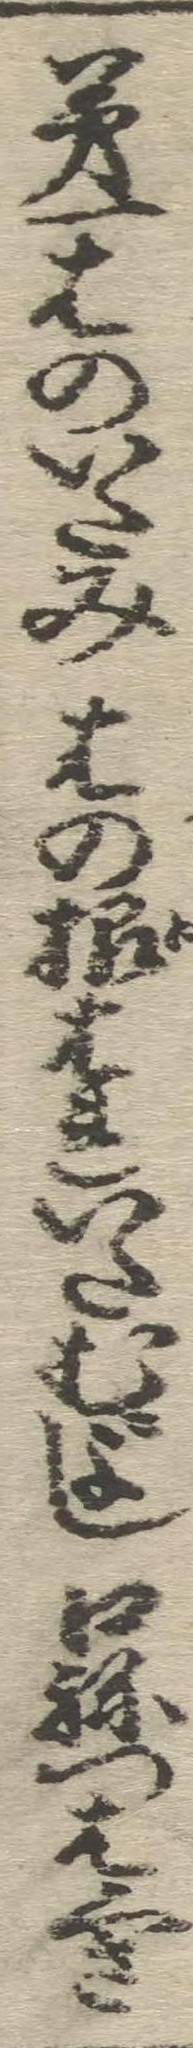第一はのいたみはの根はれいたむによし口ねつはくき
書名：浪華薬種問屋能書張交帖. 二
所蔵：国立国会図書館 National Diet Library, JAPAN
